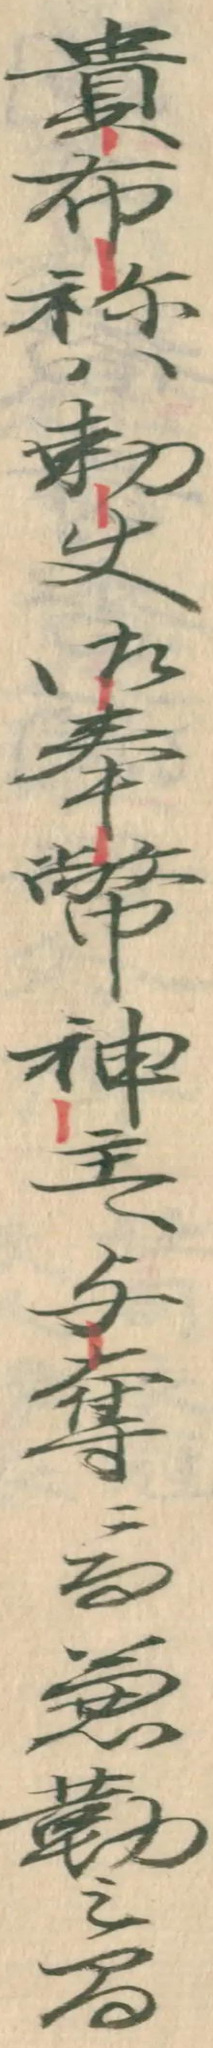貴-布-祢ハ勅-使御-奉-幣神_主へ与-奪ニ而兼勤之間
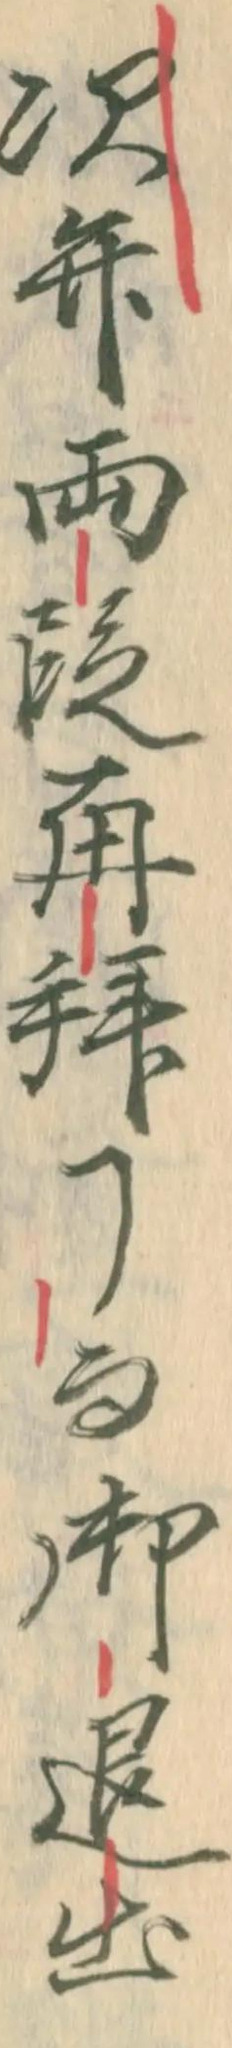次弁両-段再-拝了_而御-退-出

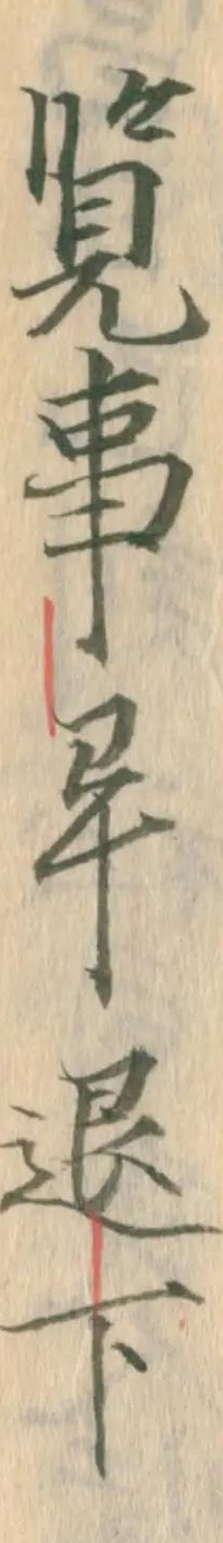覧事_畢退-下

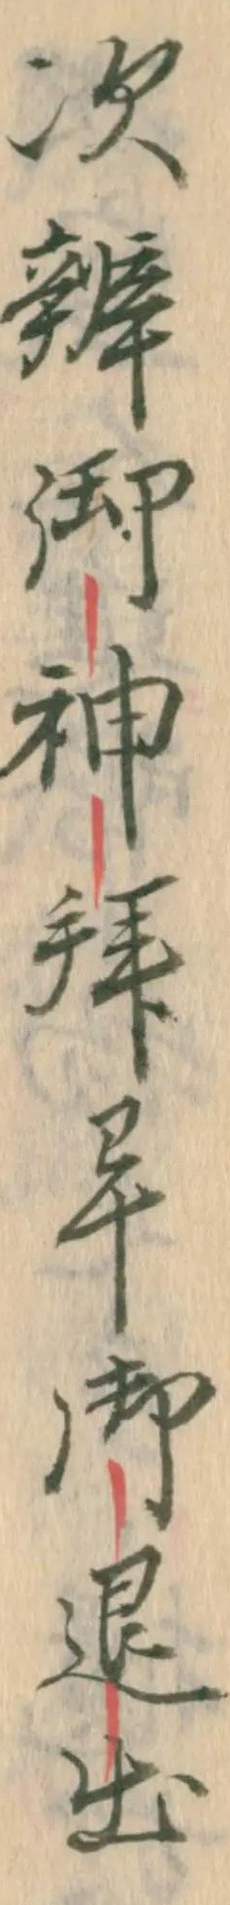次弁御-神-拝畢御-退-出
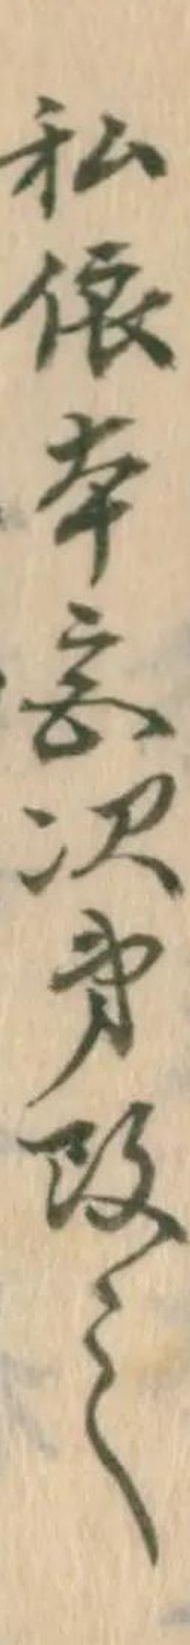私依本宮次第改之
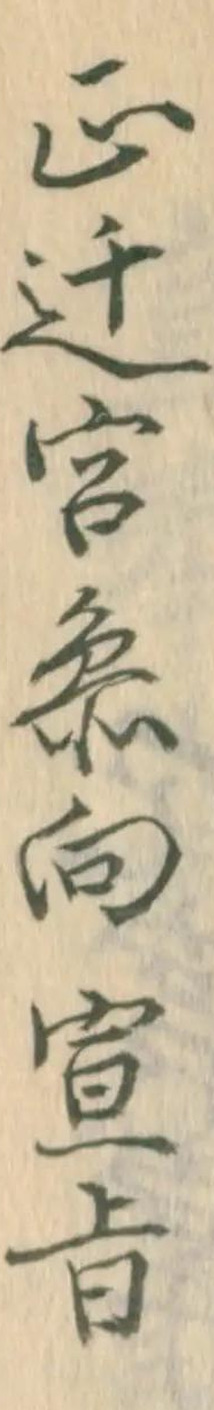正迁宮参向宣旨
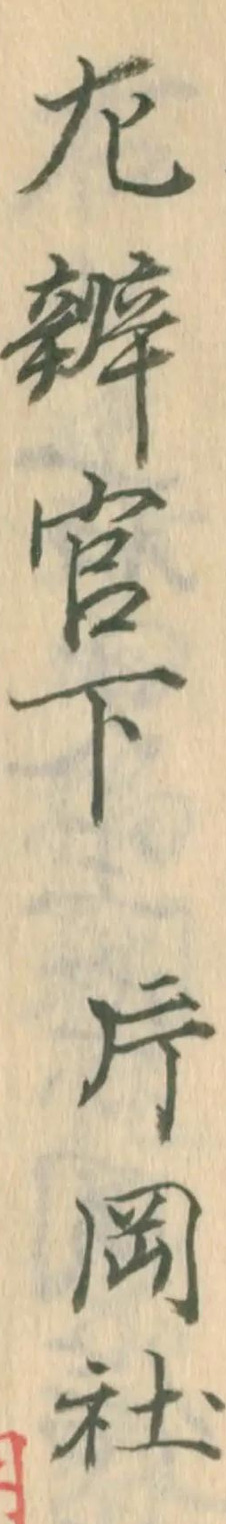左弁官下片岡社
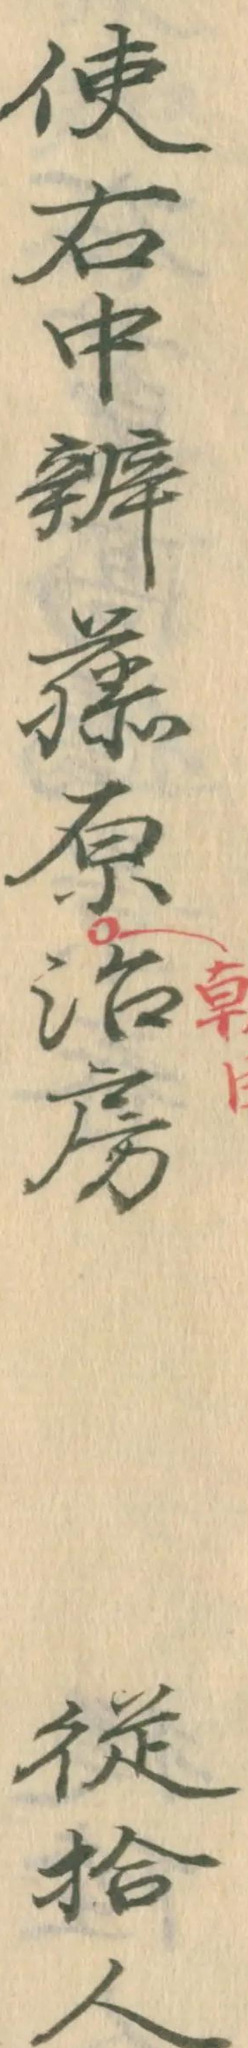使右中弁藤原￮治房従拾人

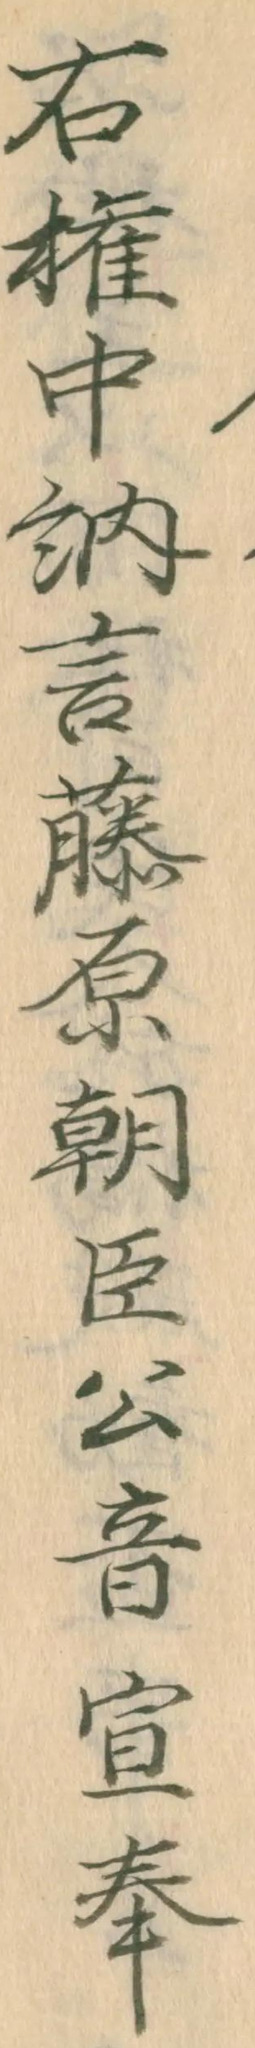右権中納言藤原朝臣公音宣奉
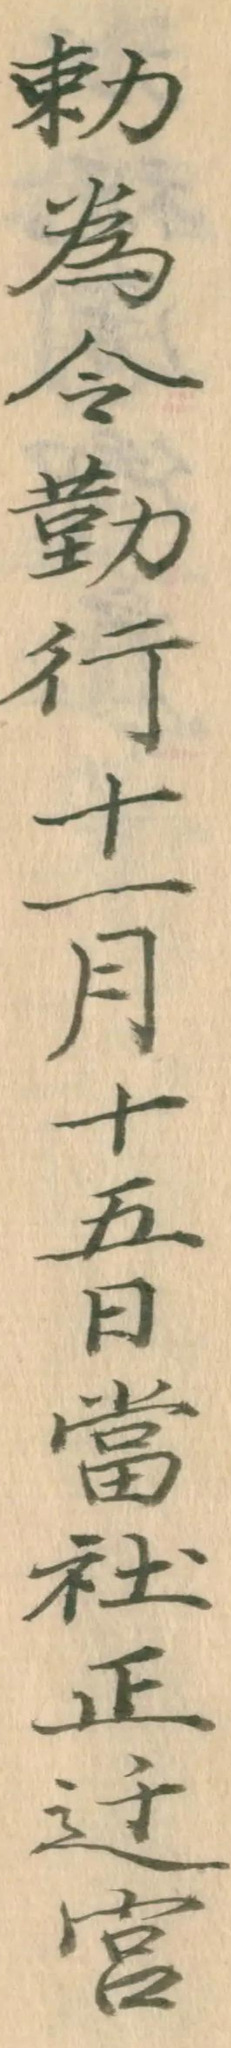勅為令勤行十一月十五日当社正迁宮
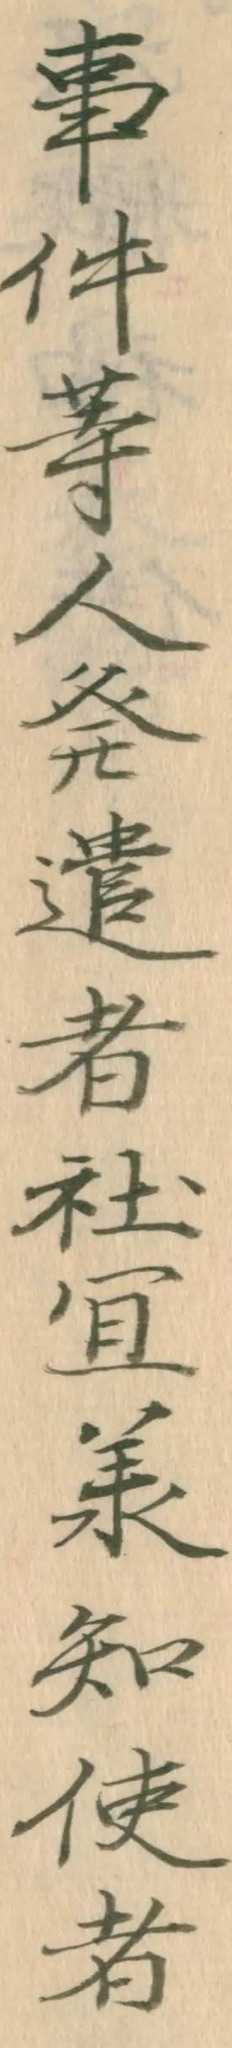事件等人発遣者社宜承知使者
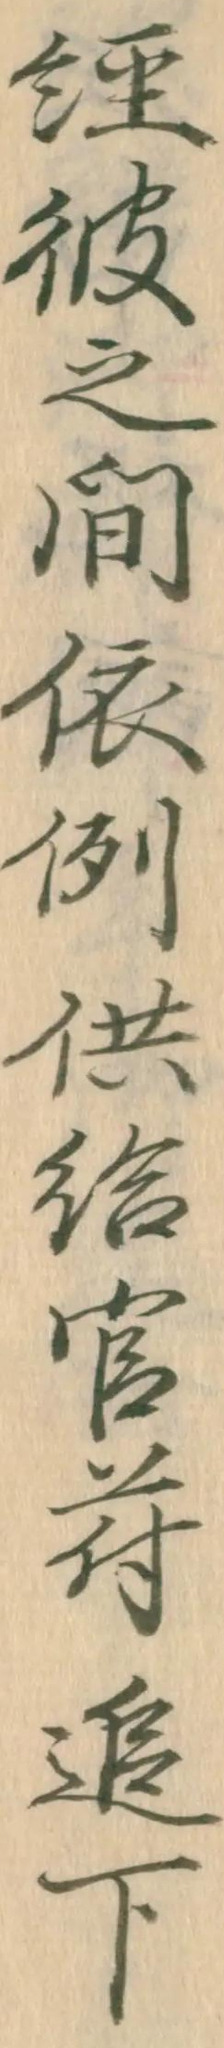経彼之間依例供給官符追下
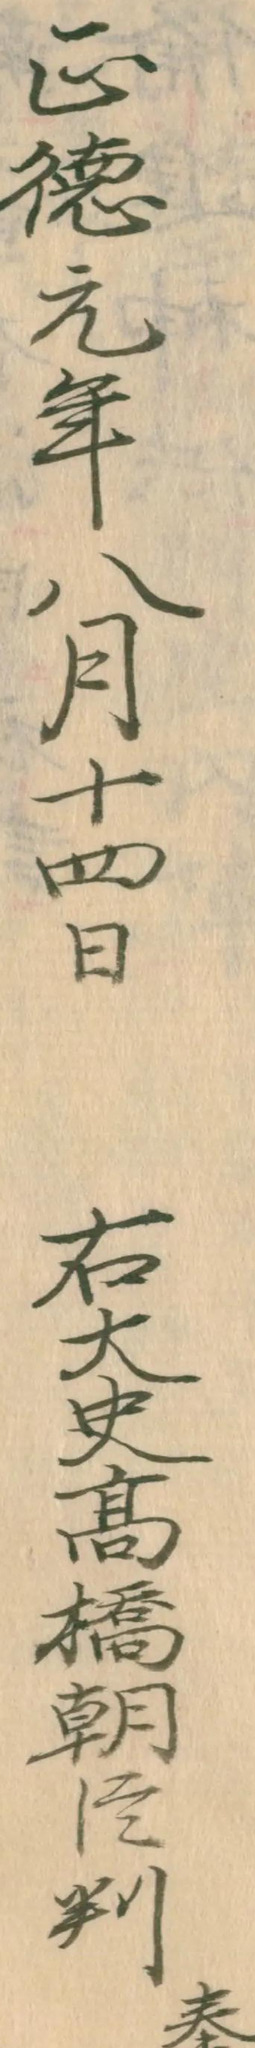正徳元年八月十四日右大史高橋朝臣判奉
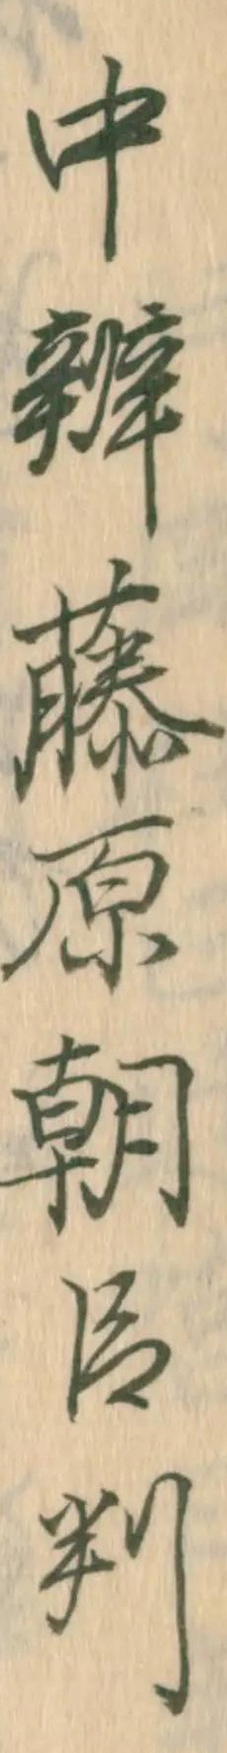中弁藤原朝臣判
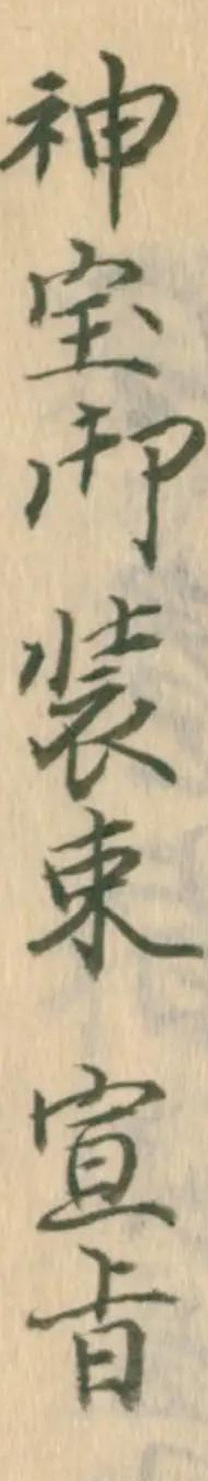神宝御装束宣旨
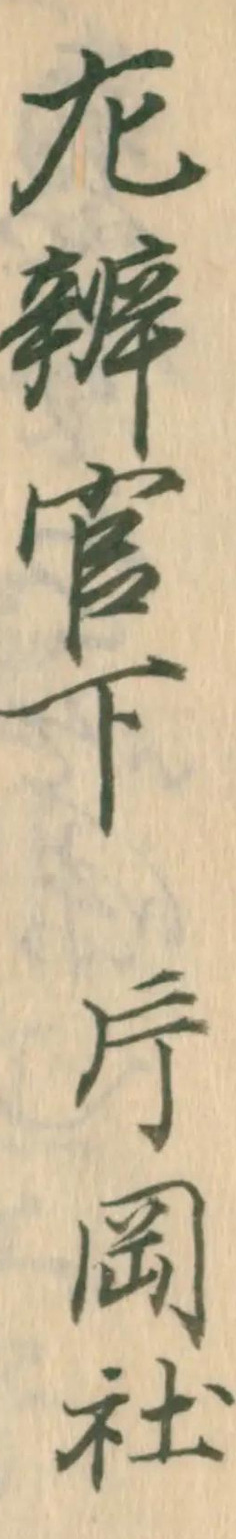左弁官下片岡社
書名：賀茂社記録. 第16冊
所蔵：国立国会図書館 National Diet Library, JAPAN
